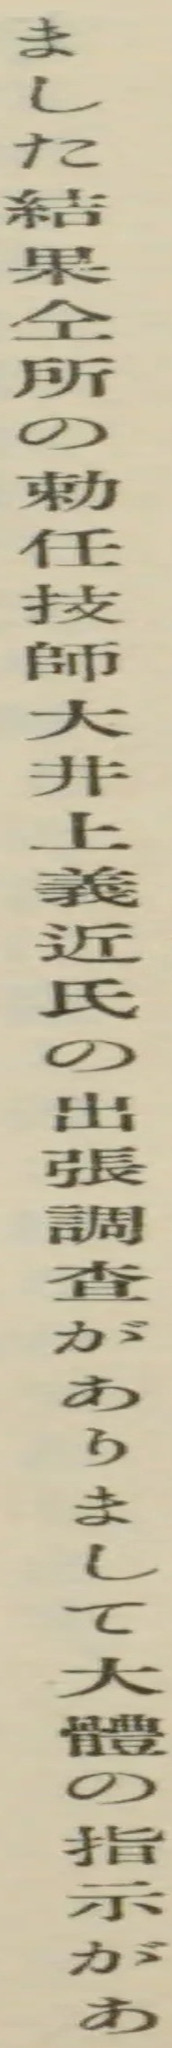ました結果同所の勅任技師大井上義近氏の出張調査がありまして大體の指示があ
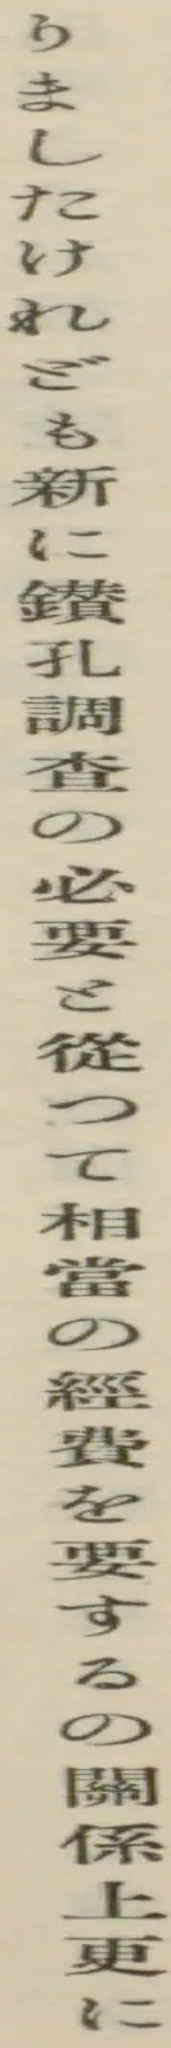りましたけれども新に鑚孔調査の必要を従って相当の経費を要するの関係上更に
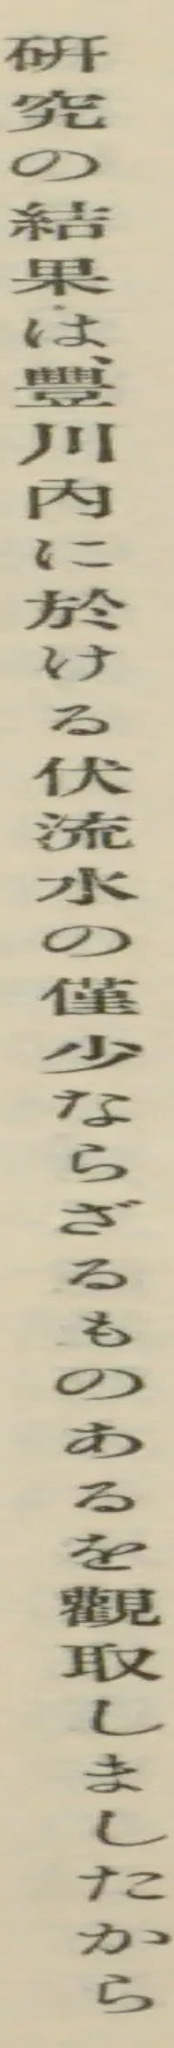研究の結果は、豊川内に於ける伏流水の僅少ならざるものあるを観取しましたから
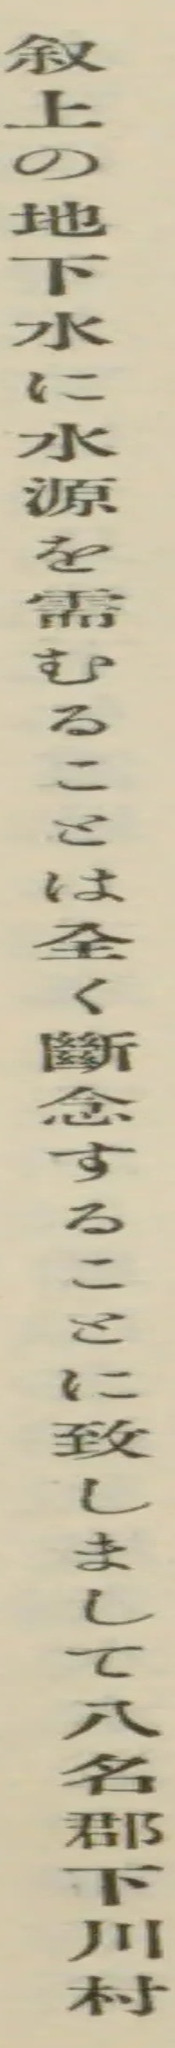叙上の地下水に水源を需むることは全く断念することに致しまして八名郡下川村
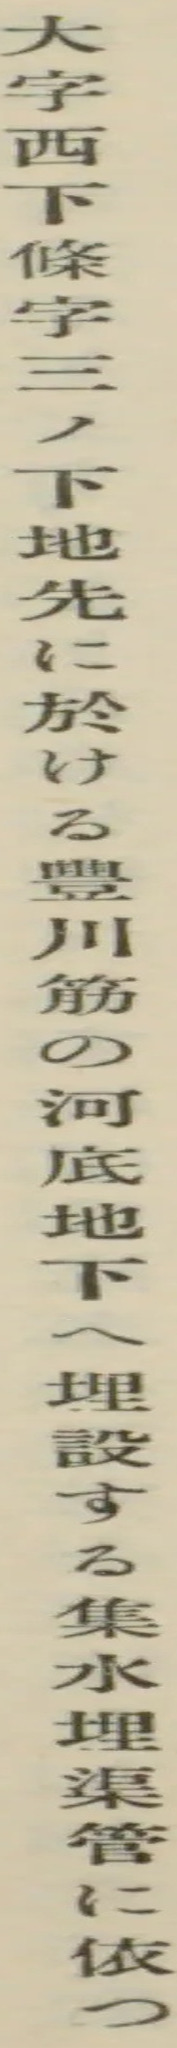大字西下條字三の下地先に於ける豊川筋の河底地下へ埋設する集水埋渠管に依つ
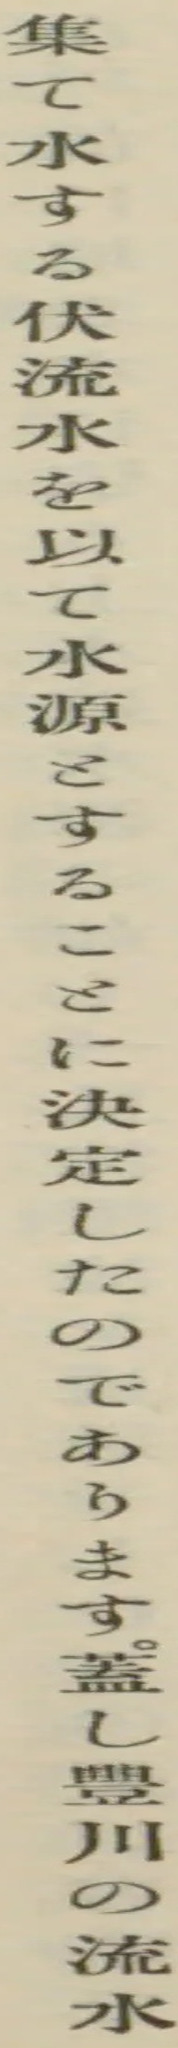集て水する伏流水を以て水源とすることに決定したのであります。蓋し豊川の流水
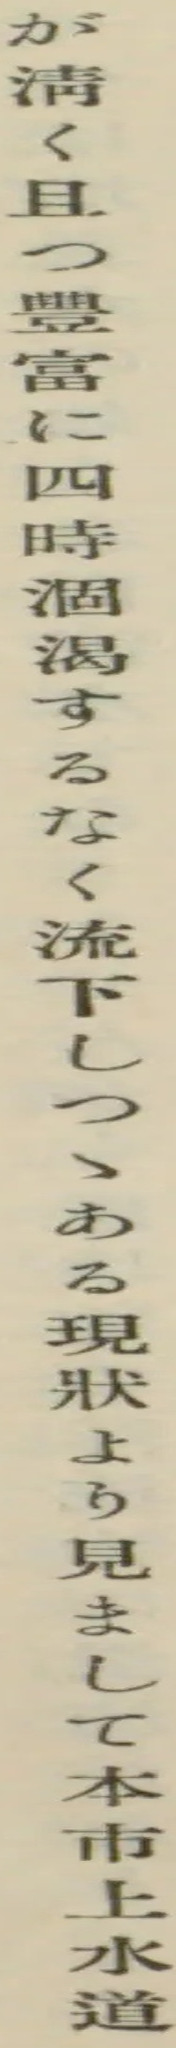が清く且つ豊富に四時涸渇するなく流下しつゝある現状より見ましても本市上水道
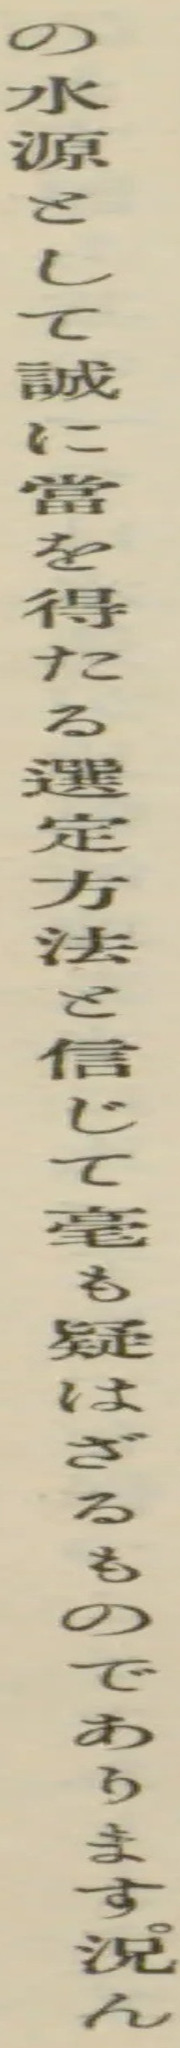の水源として誠に当を得たる選定方法と信じて毫も疑はざるものであります。況ん
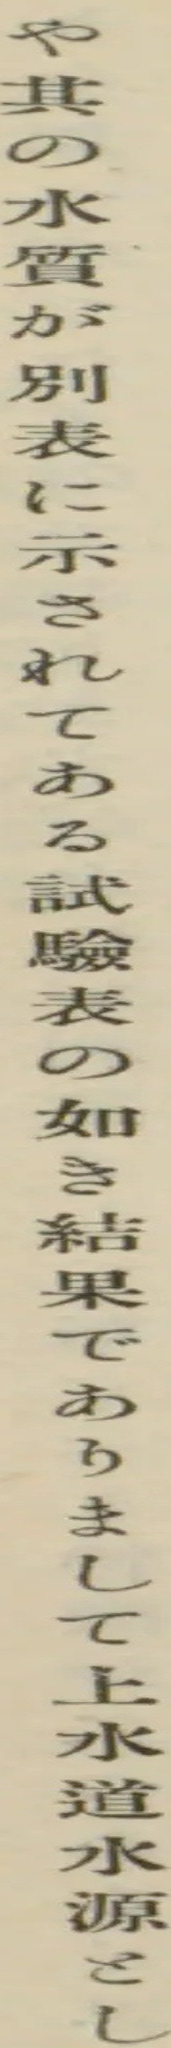や其の水質が別表に示されてある試験表の如き結果でありまして上水道水源とし
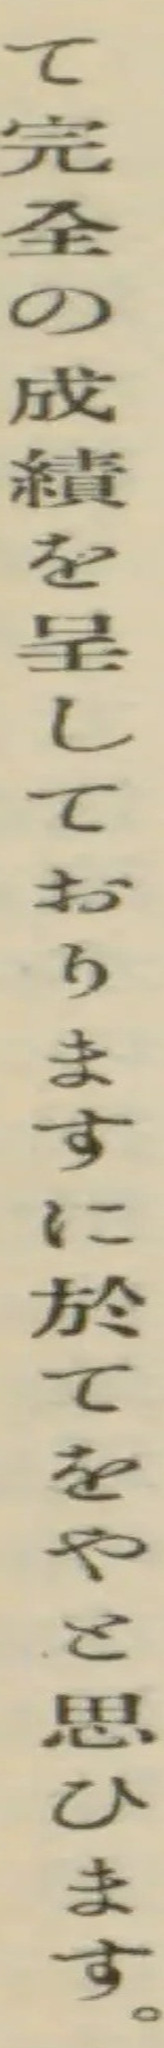て完全の成績を呈しておりますに於てをやと思ひます。

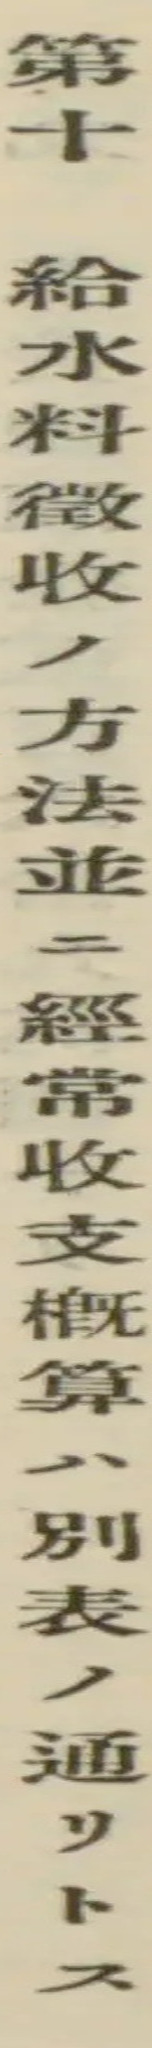第十給水料徴収の方法並に経常収支概算は別表の通りとす
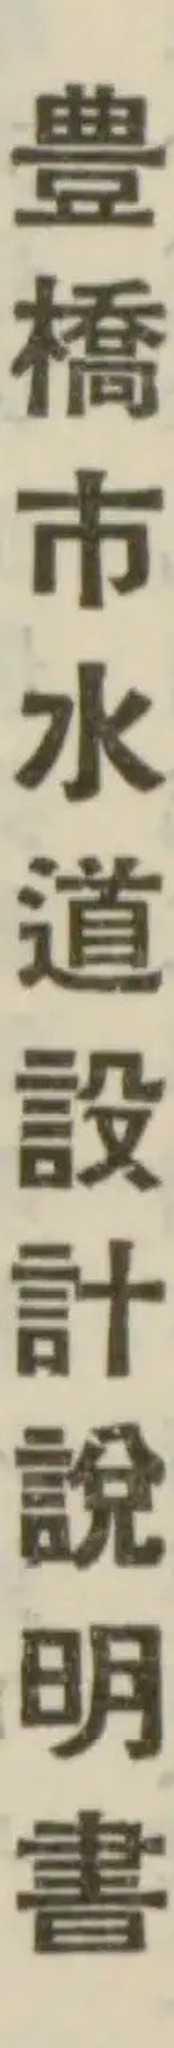豊橋市水道設計説明書
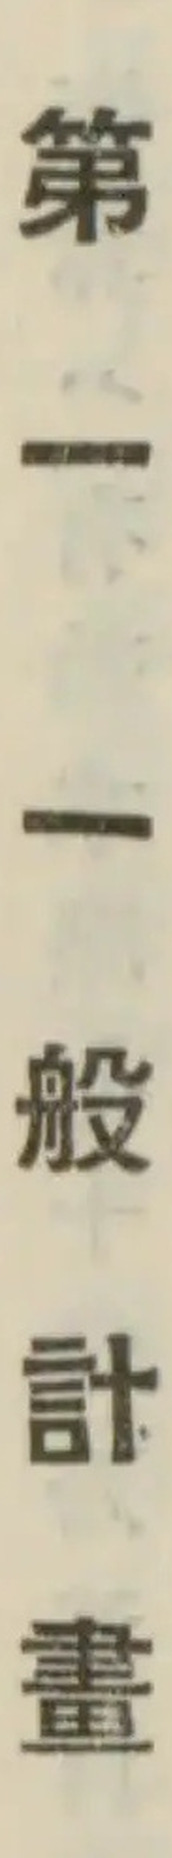第一一般計画
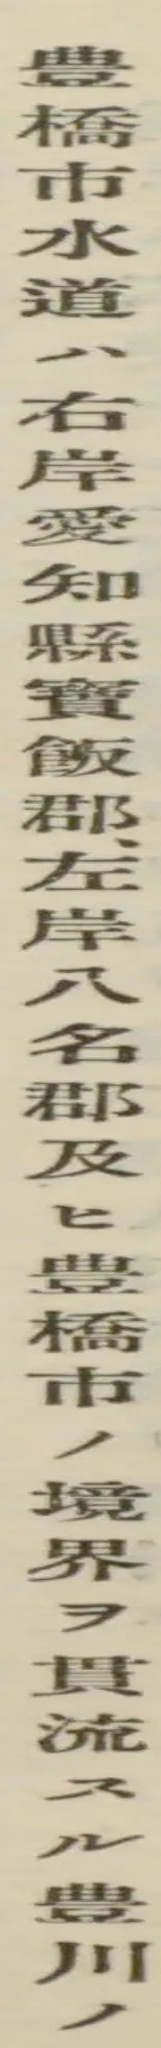豊橋市水道は右岸愛知県寶飯郡、左岸八名郡及豊橋市の境界を貫流する豊川の
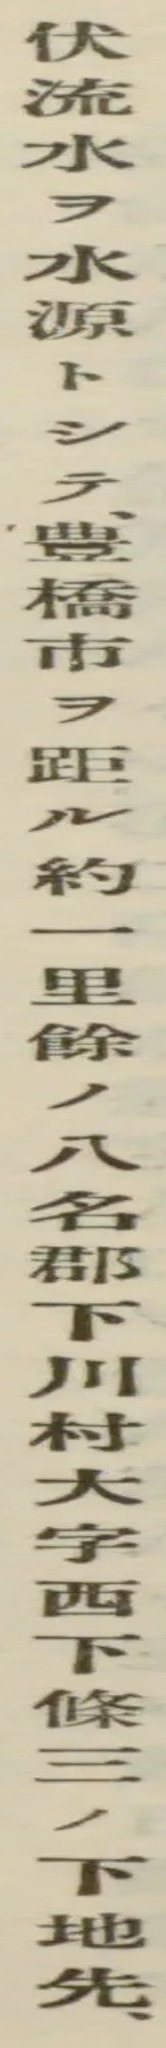伏流水を水源として、豊橋市を距る約一里余の八名郡下川村大字西下條三の下地先、
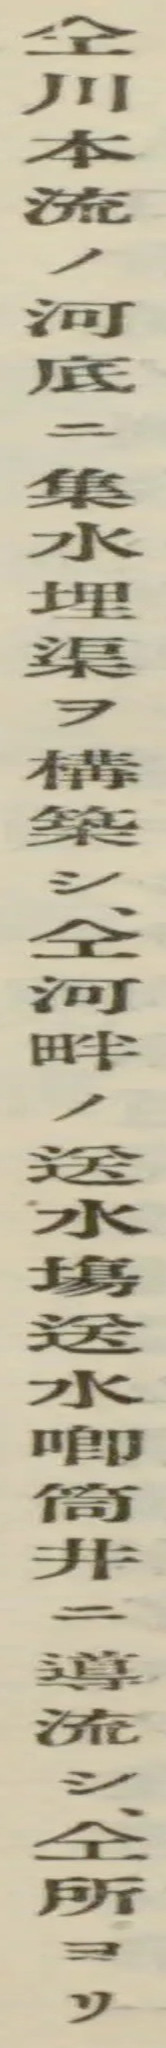同川本流の河底に集水埋渠を構築し、同河畔の送水場送水喞筒井に導流し、同所より
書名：豊橋市水道誌
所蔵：国立国会図書館 National Diet Library, JAPAN
